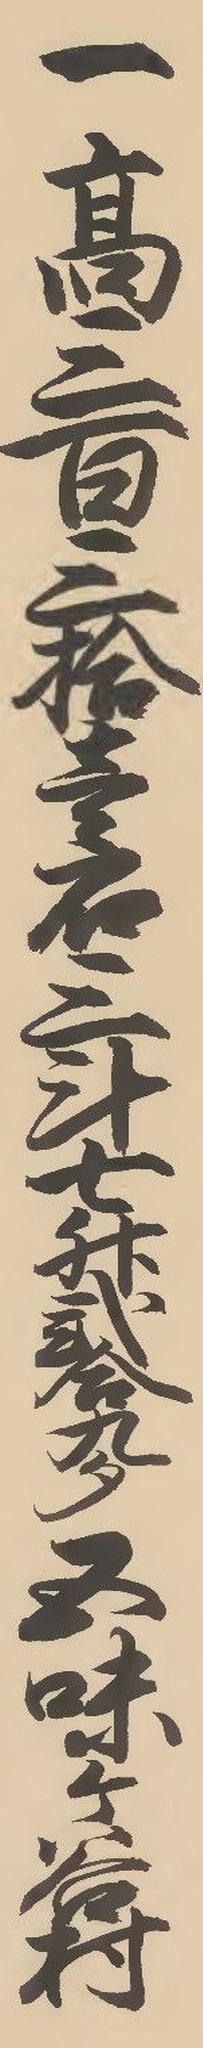一高三百三拾壱石三斗七升弐合九勺五味ヶ谷村
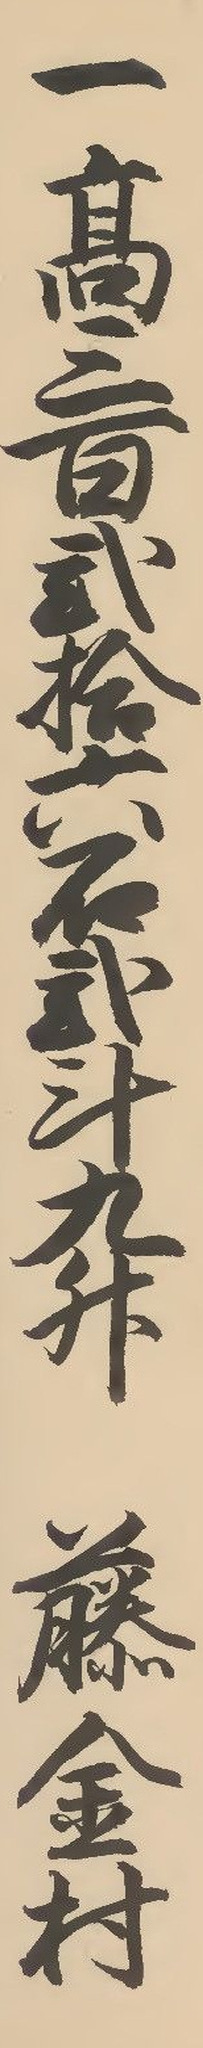一高三百弐拾六石弐斗九升藤金村
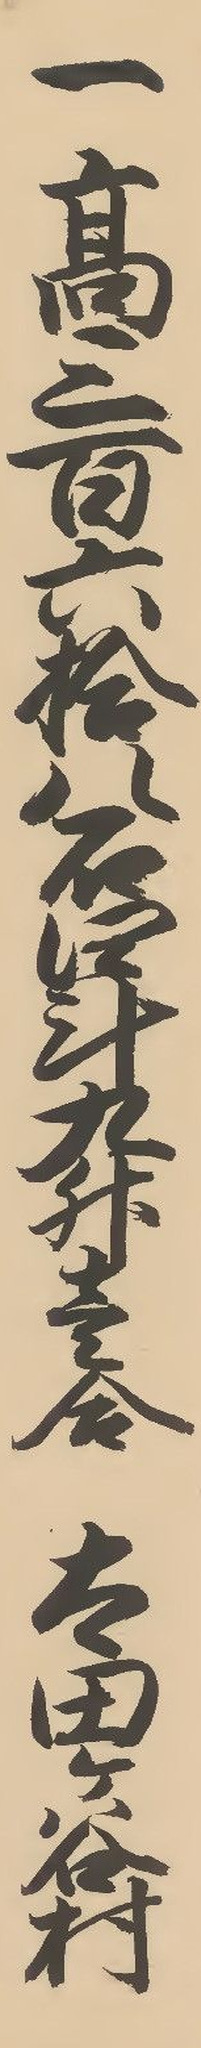一高三百六拾八石四斗九升壱合太田ヶ谷村
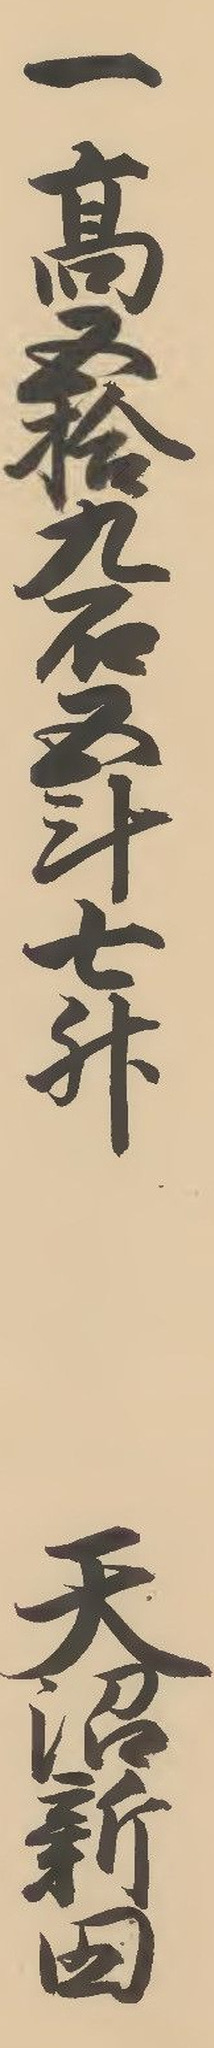一高五拾九石五斗七升天沼新田
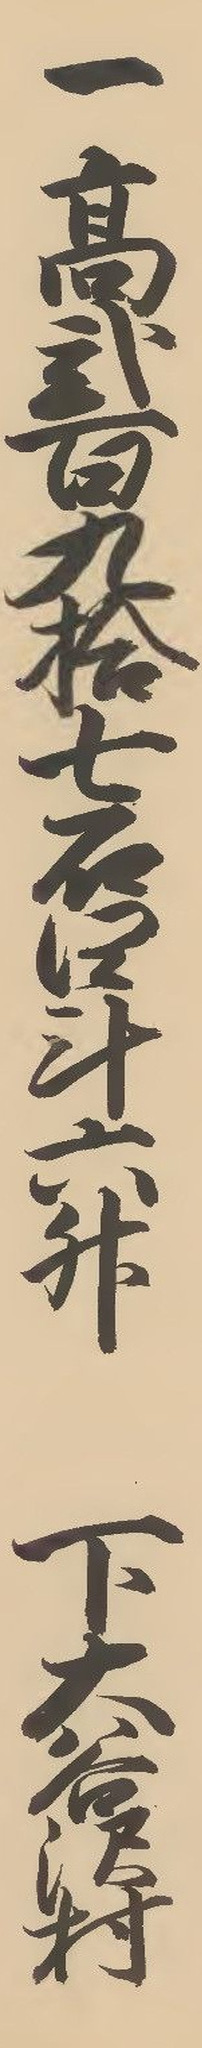一高弐百九拾七石四斗六升下大谷沢村
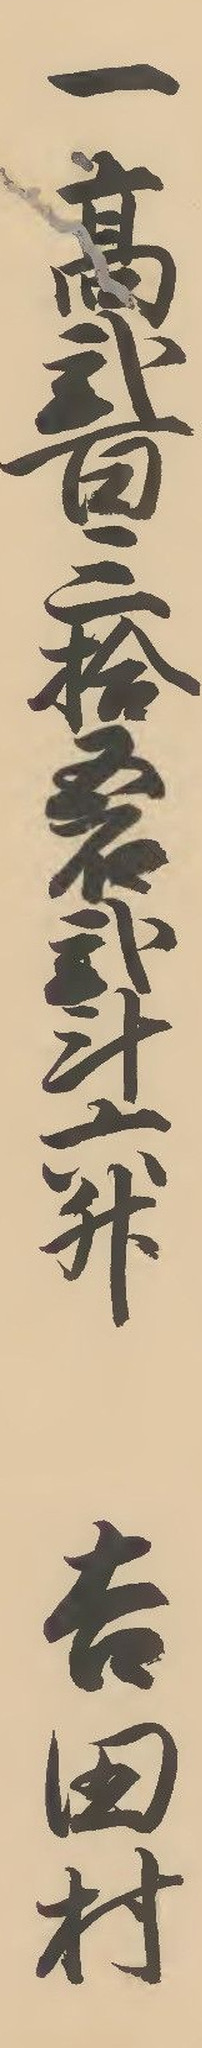一高弐百三拾五石弐斗六升吉田村

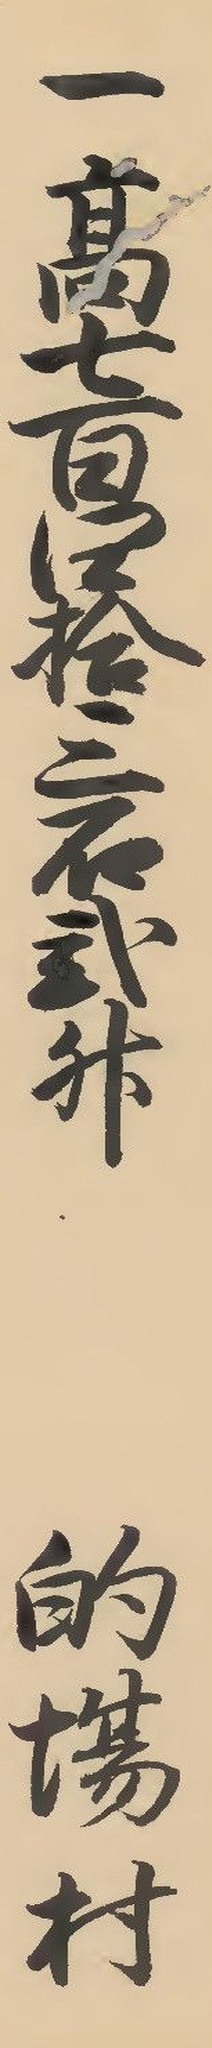一高七百四拾三石弐升的場村
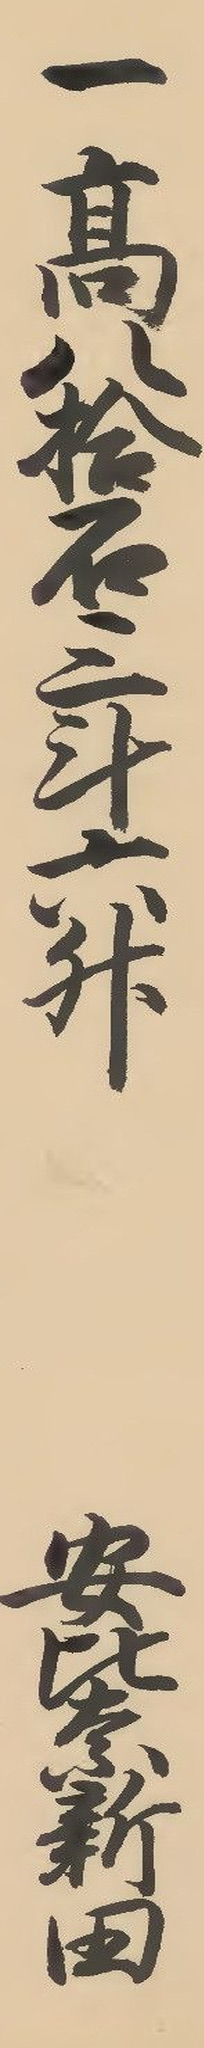一高八拾石三斗六升安比奈新田
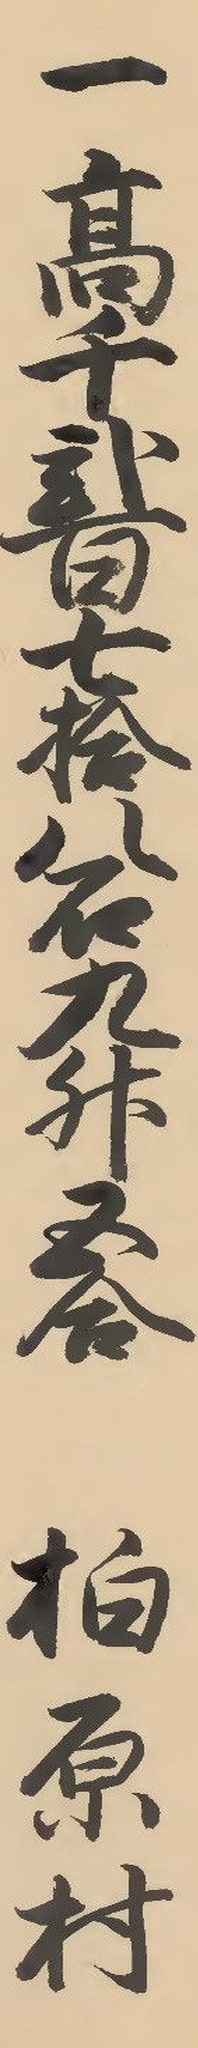一高千弐百七拾八石九升五合柏原村
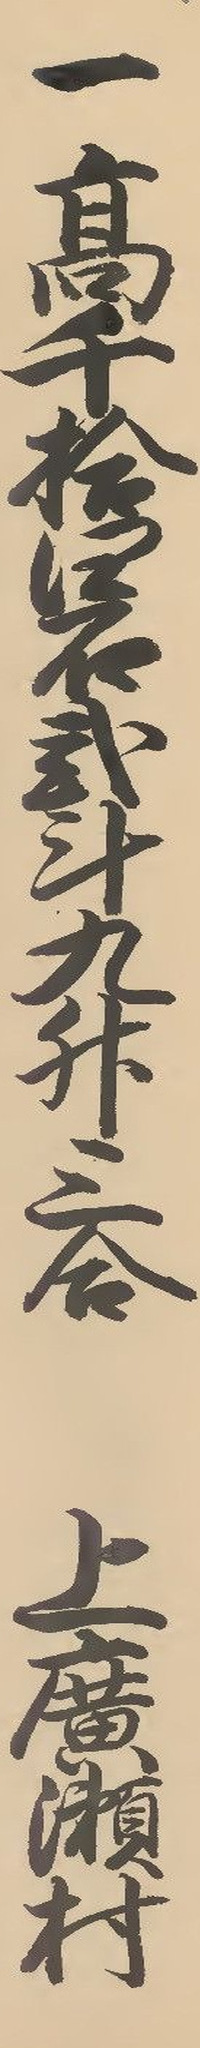一高千拾四石弐斗九升三合上広瀬村
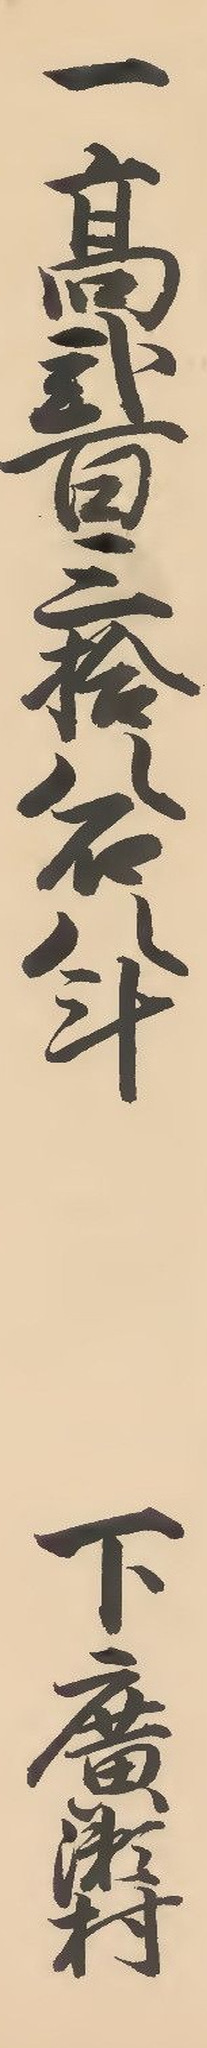一高弐百三拾八石八斗下広瀬村
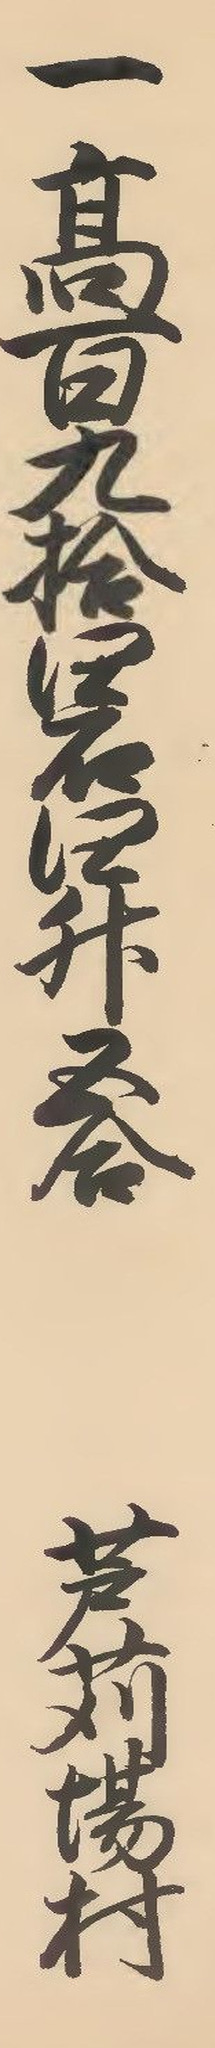一高百九拾四石四升五合芦苅場村
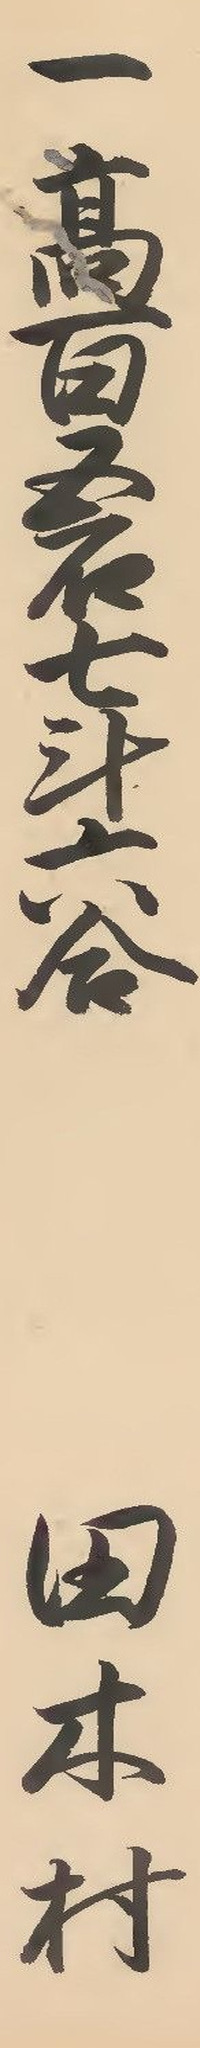一高百五石七斗六合田木村

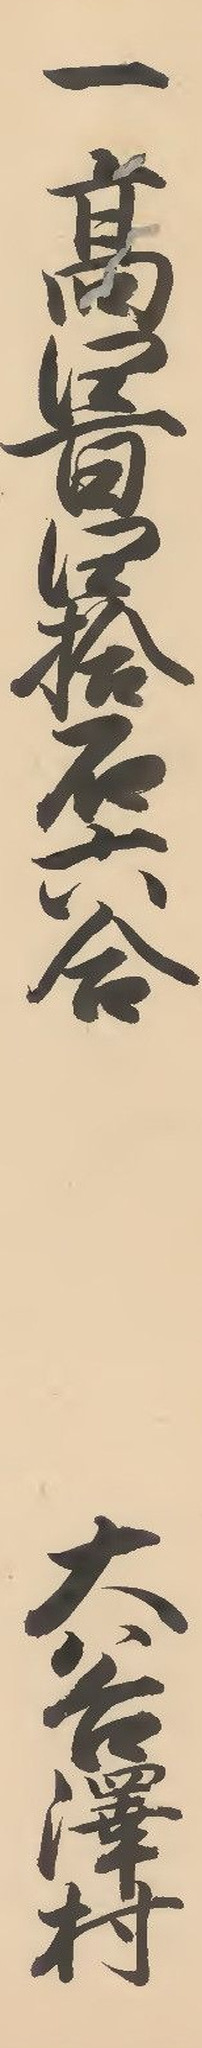一高四百四拾石六合大谷澤村
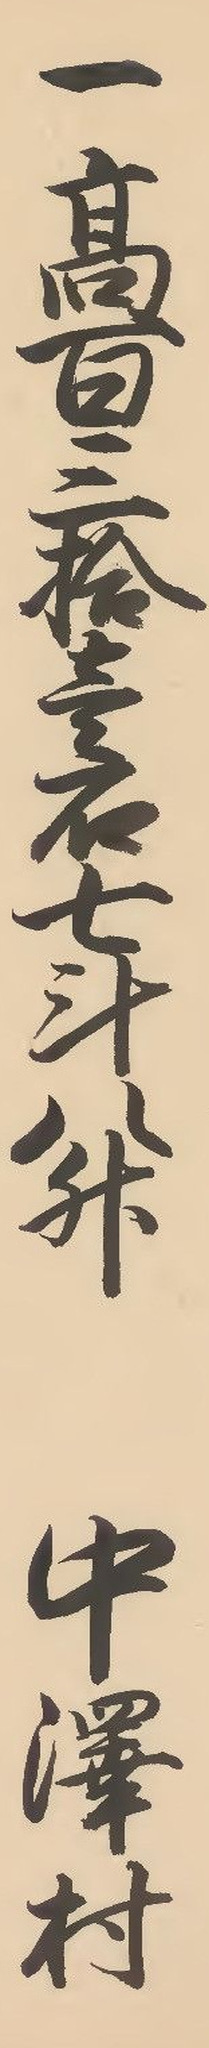一高百三拾壱石七斗八升中澤村
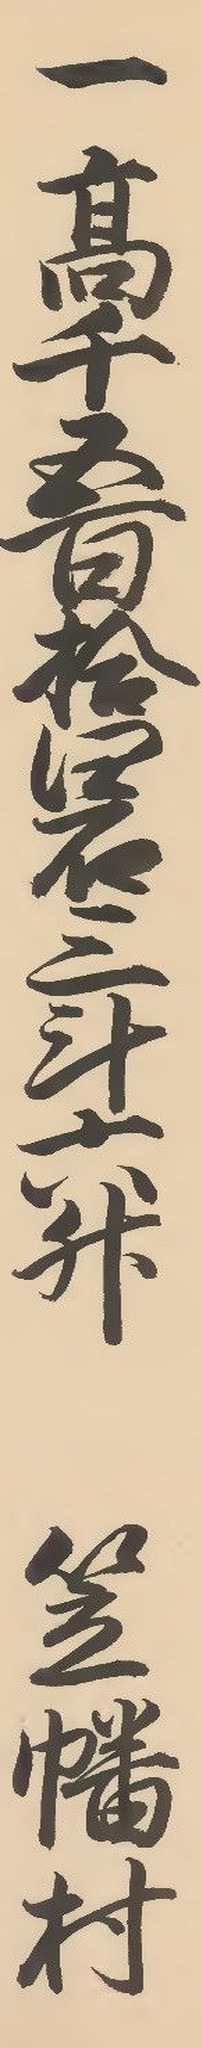一高千五百拾四石三斗六升笠播村
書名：武蔵国郷帳　上
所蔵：国立公文書館 National Archives of Japan
